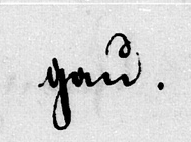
gau.
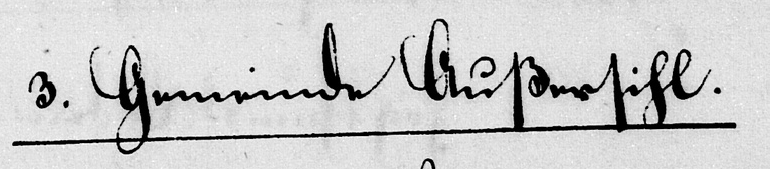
3. Gemeinde Außersihl.
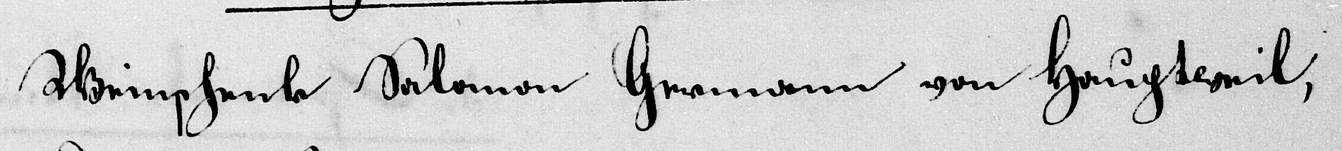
Weinschenk Salomon Germann von Hauptweil,
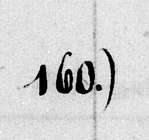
160.)
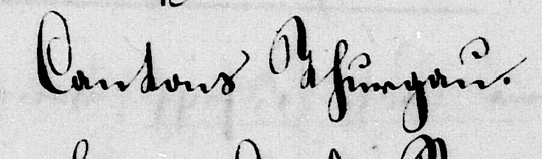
Cantons Thurgau.
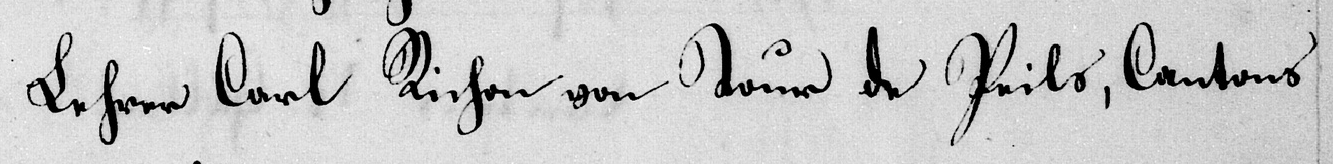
Lehrer Carl Richon von Tour de Peils, Cantons
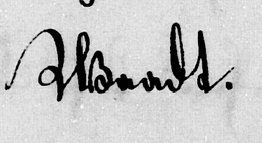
Waadt.
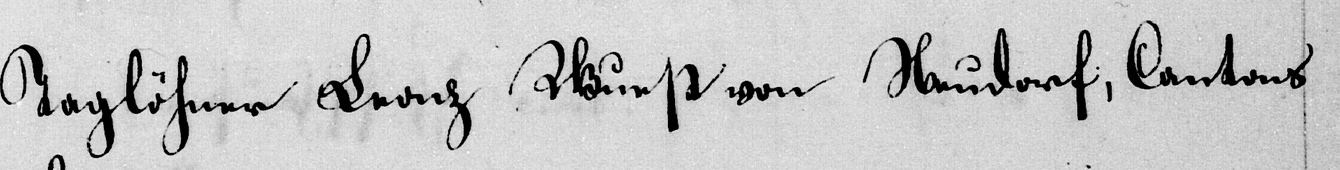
Taglöhner Leonz Wuest von Neudorf, Cantons
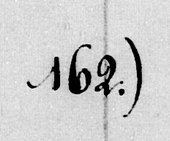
162.)
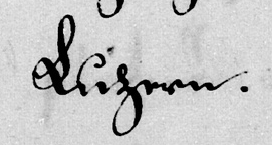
Luzern.
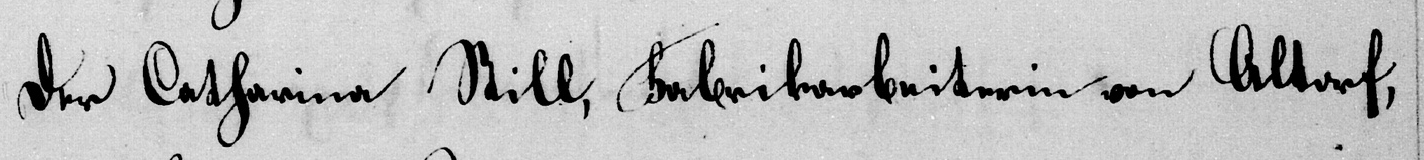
Der Catharina Still, Fabrikarbeiterin von Altorf,
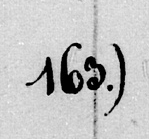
163.)
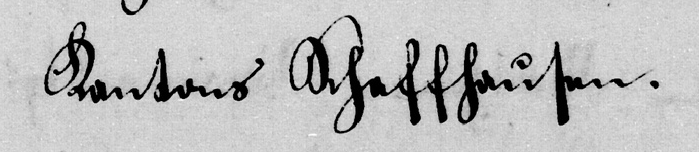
Kantons Schaffhausen.
